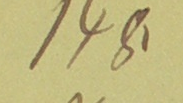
148
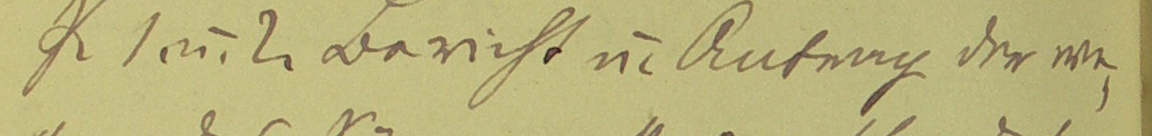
P 1 und 2 Bericht und Antrag der we¬
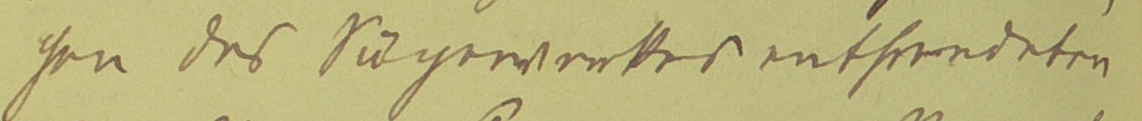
gen des Sägewerkes entsendeten
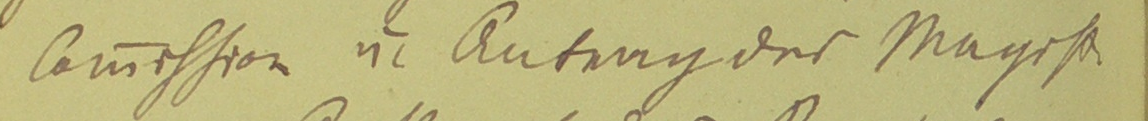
Commission und Antrag des Magistrats
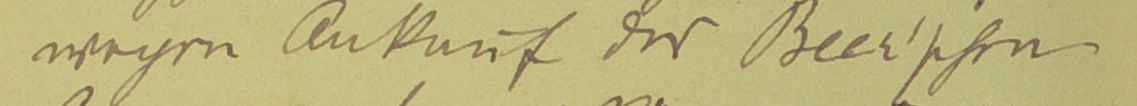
wegen Ankauf des Beer´schen
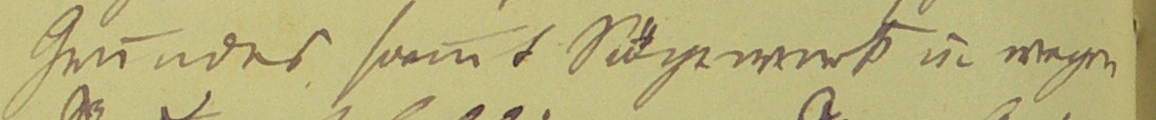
Grundes samt Sägewerk und wegen
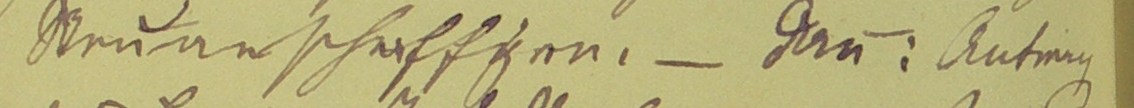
Steuerschätzungen.—Dann: Antrag
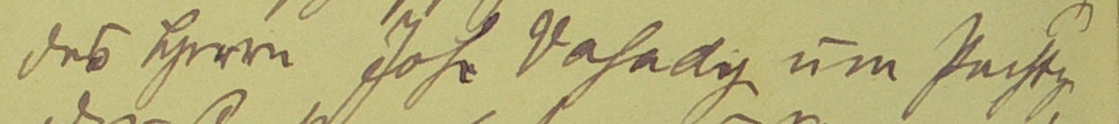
des Herrn Josef Vahady um Pacht
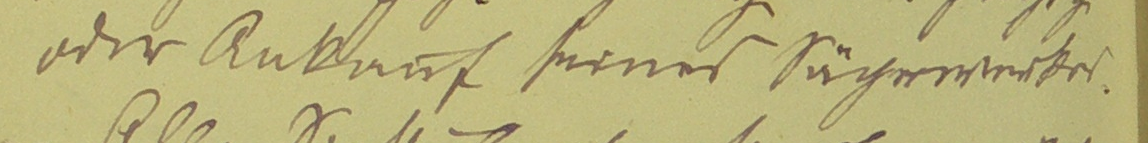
oder Ankauf seines Sägewerkes.
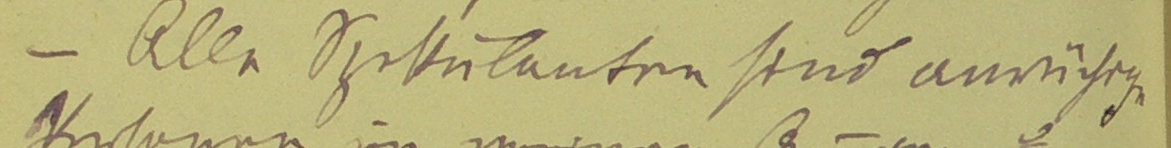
—Alle Spekulanten sind anrüchige
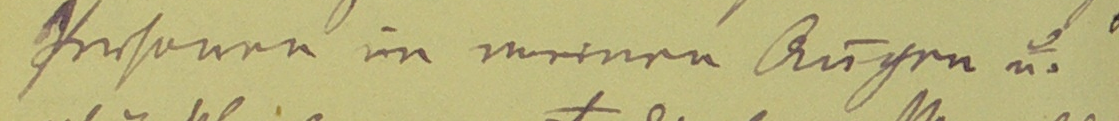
Personen in meinen Augen und
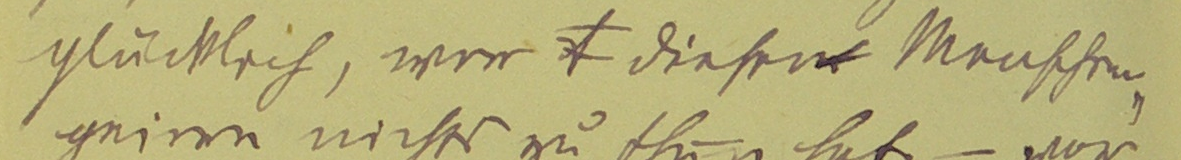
glücklich, wer mit diesen Menschen¬
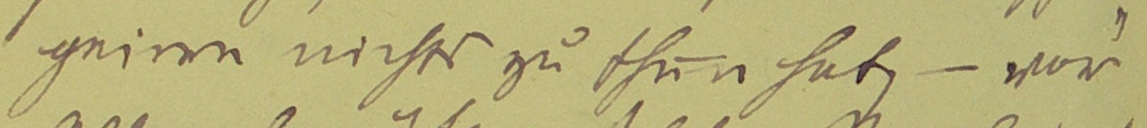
geierrn nichts zu thun hat,--vor
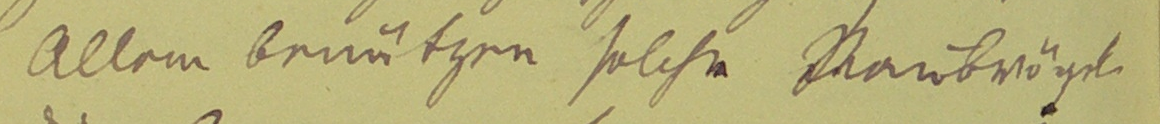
allem benützen solche Raubvögel
